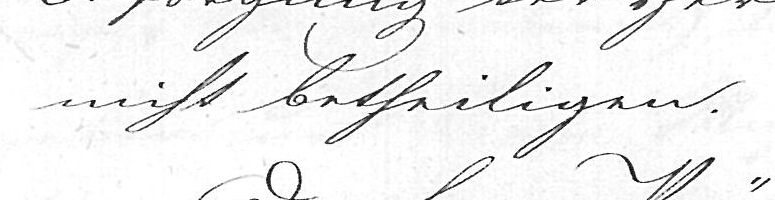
nicht betheiligen.
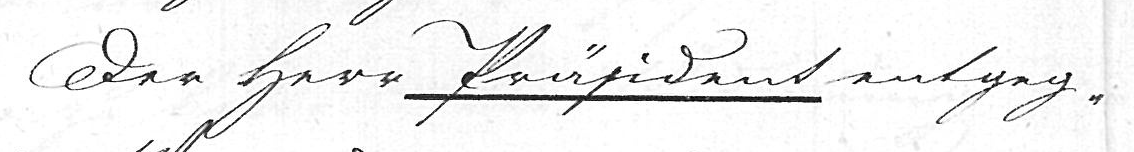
Der Herr Präsident entgeg-
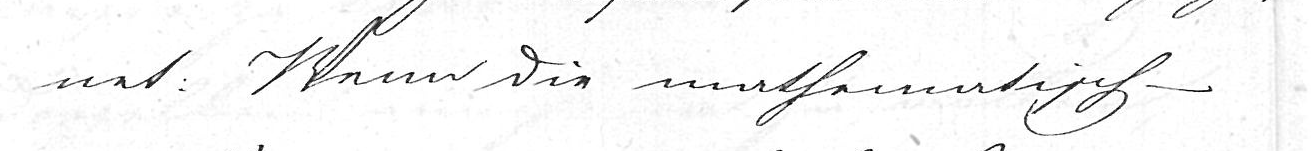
net: Wenn die mathematisch-
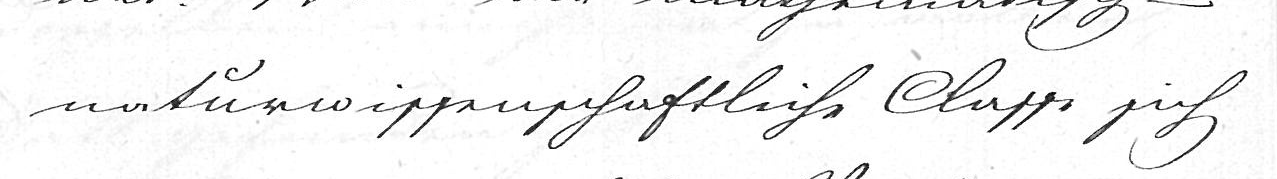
naturwissenschaftliche Classe sich
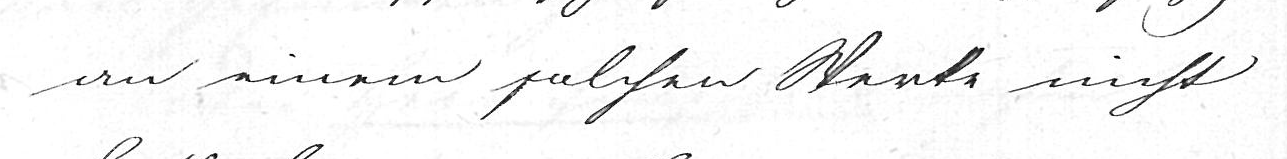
an einem solchen Werke nicht
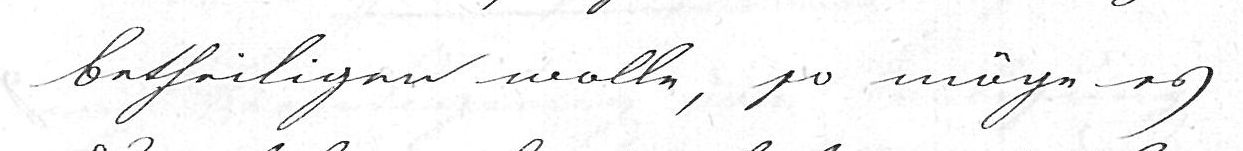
betheiligen wolle, so möge es
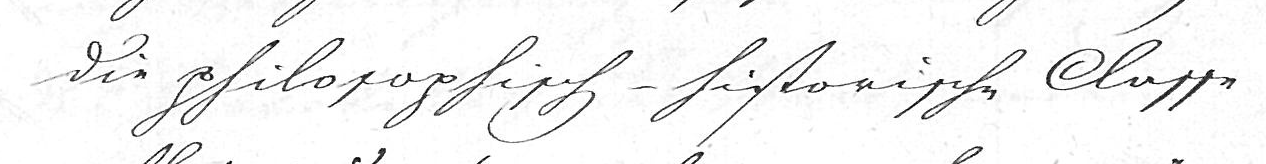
die philosophisch-historische Classe
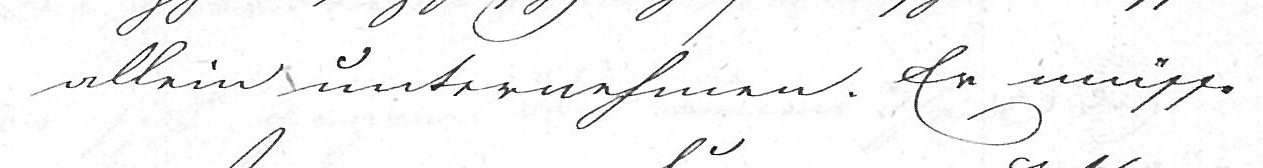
allein unternehmen. Er müsse
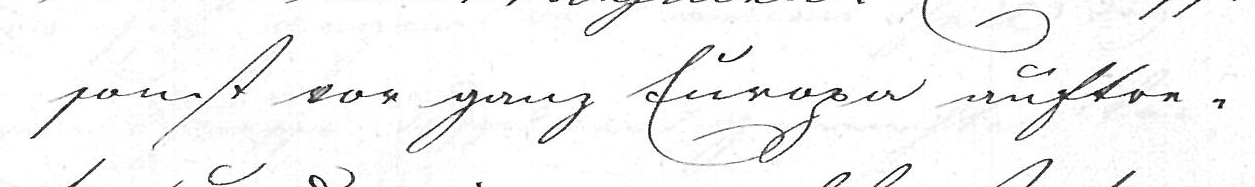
sonst vor ganz Europa auftre-
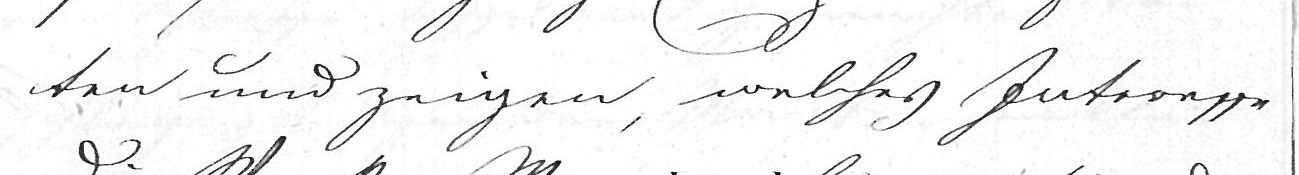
ten und zeigen, welches Interesse
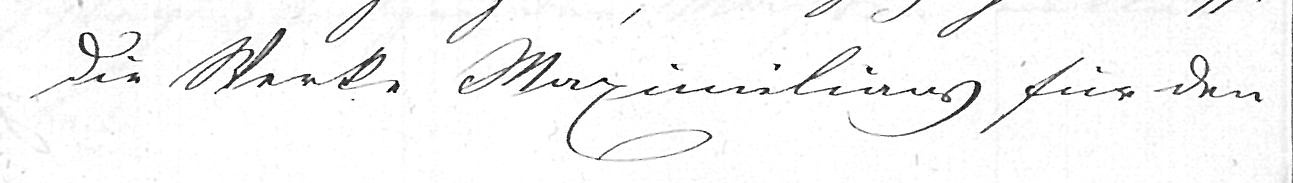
die Werke Maximilians für den
